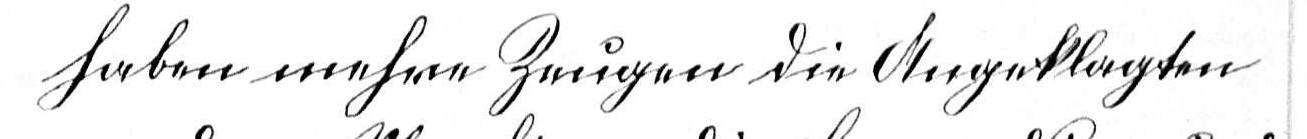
haben mehre Zeugen die Angeklagten
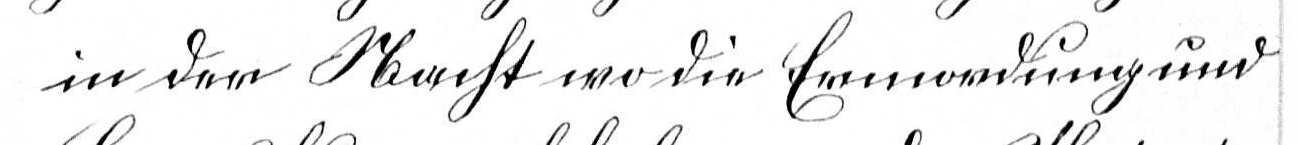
in der Nacht wo die Ermordung und
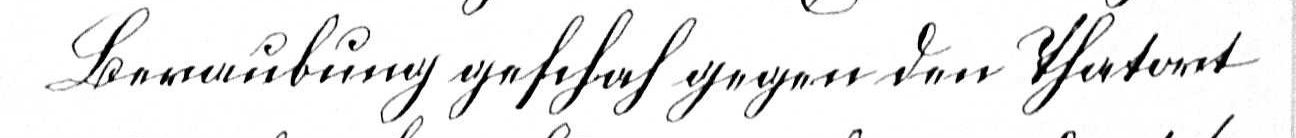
Beraubung geschah gegen den Thatort
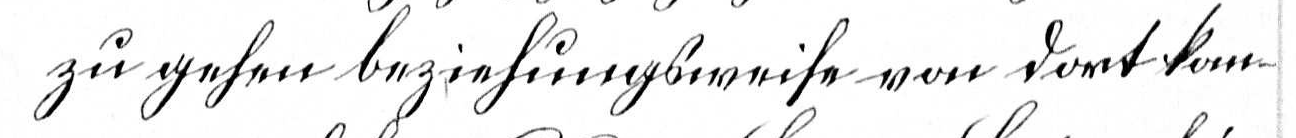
zu gehen beziehungsweise von dort kom¬
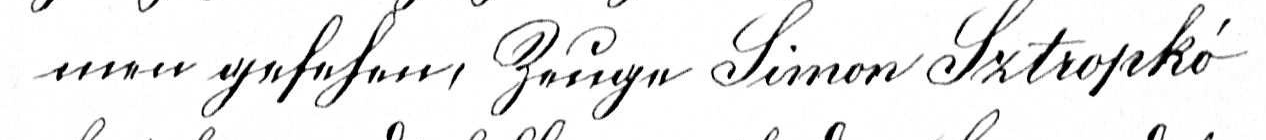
men gesehen, Zeuge Simon Sztropkó
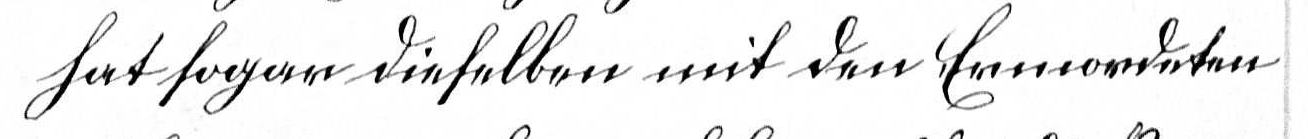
hat sogar dieselben mit den Ermordeten
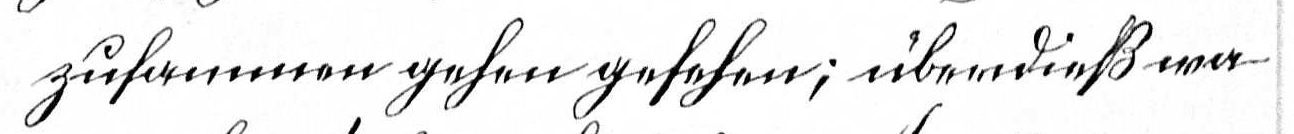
zusammen gehen gesehen; überdieß wa¬
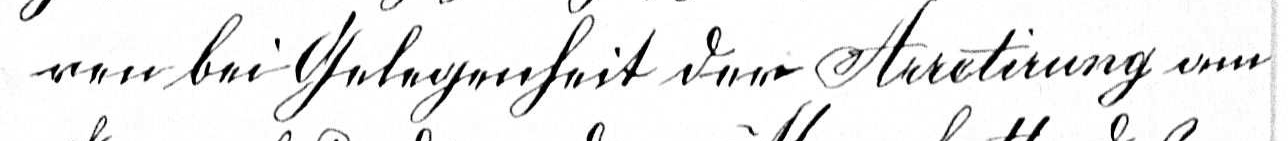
ren bei Gelegenheit der Arretirung am
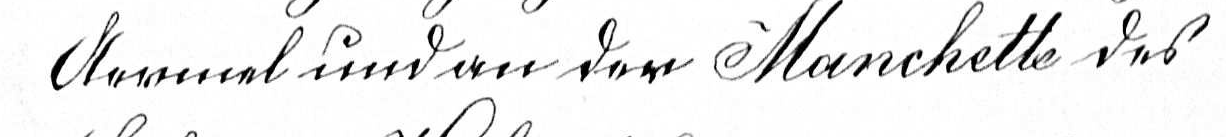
Aermel und an der Manchette des
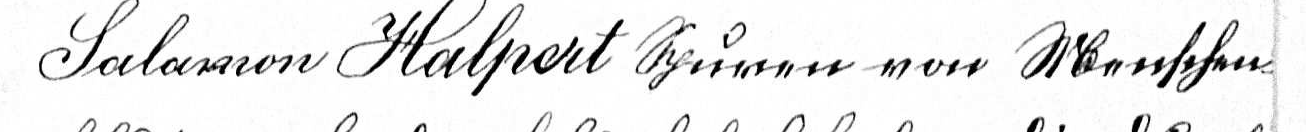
Salamon Halpert Spuren von Menschen¬
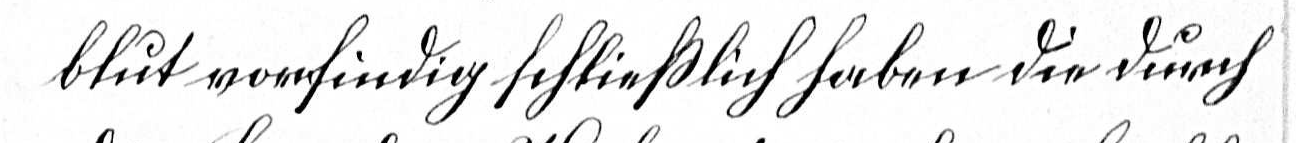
blut vorfindig schließlich haben die durch
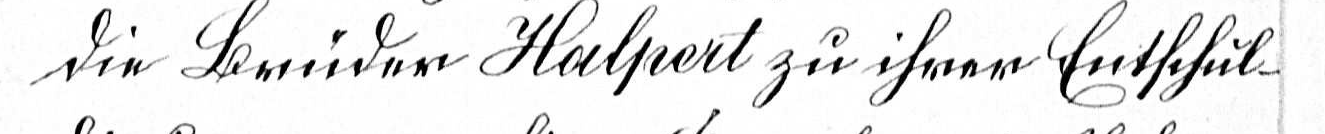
die Brüder Halpert zu ihrer Entschul¬
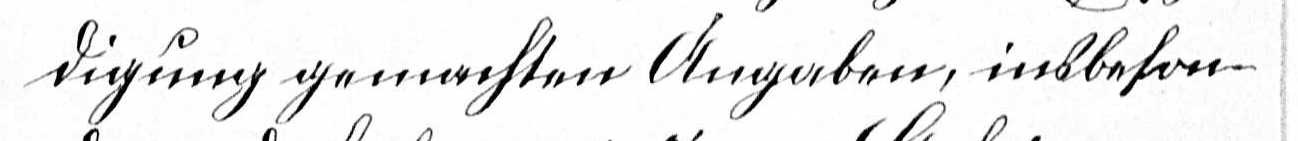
digung gemachten Angaben, insbeson¬
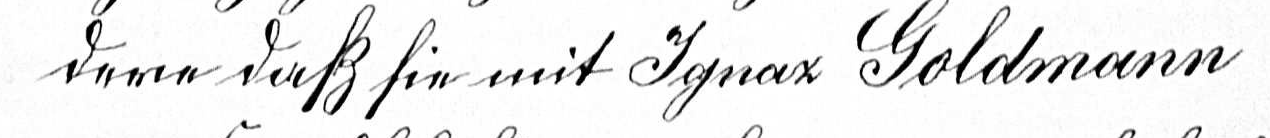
dere daß sie mit Jgnaz Goldmann
